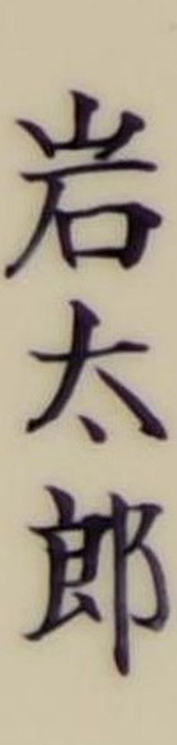岩太郎

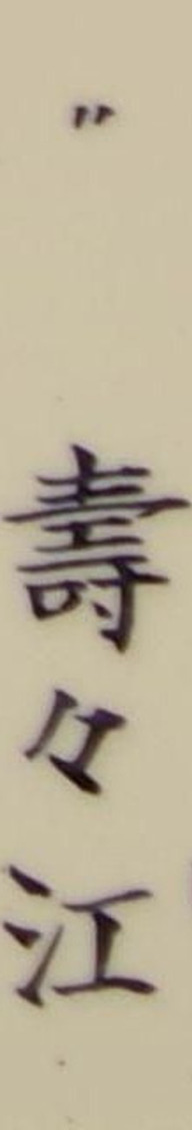壽々江
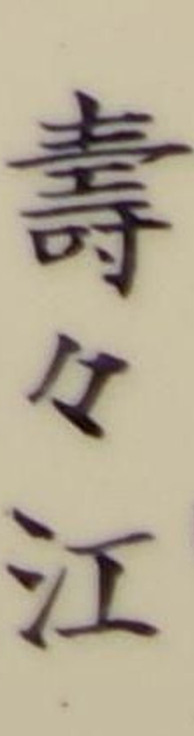壽々江
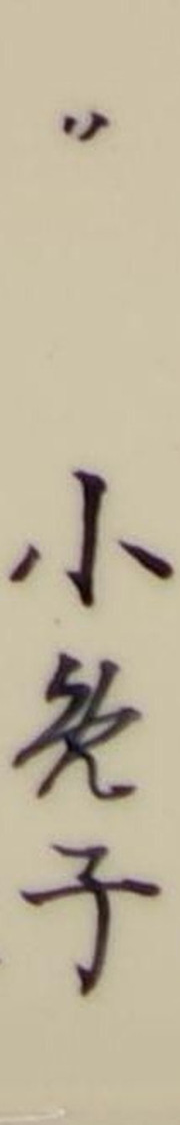こめ子
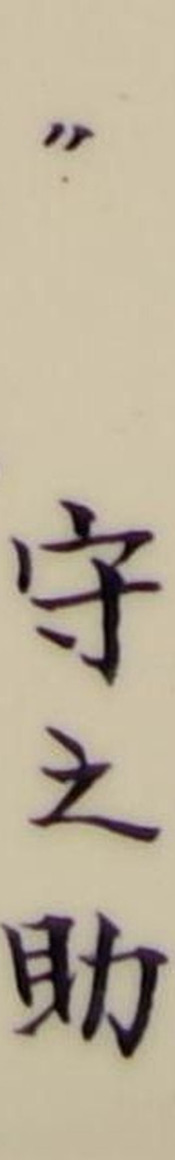守之助
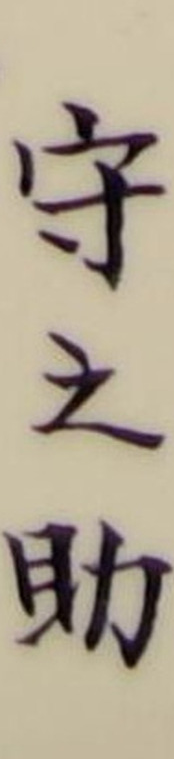守之助
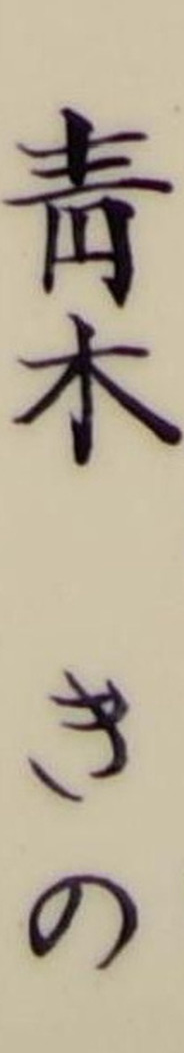青木きの
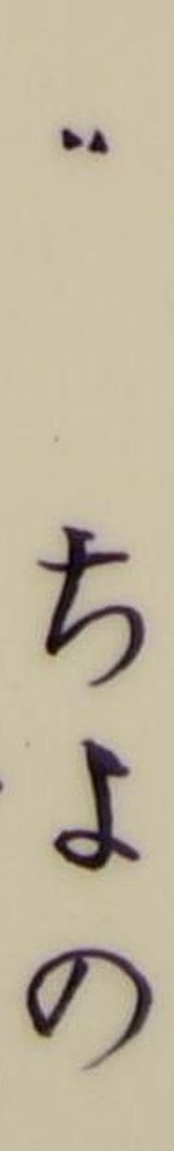ちよの
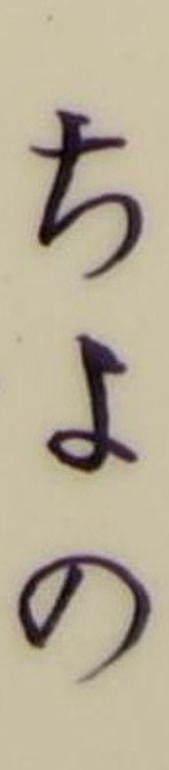ちよの
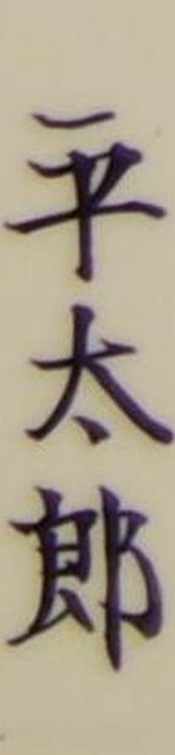平太郎

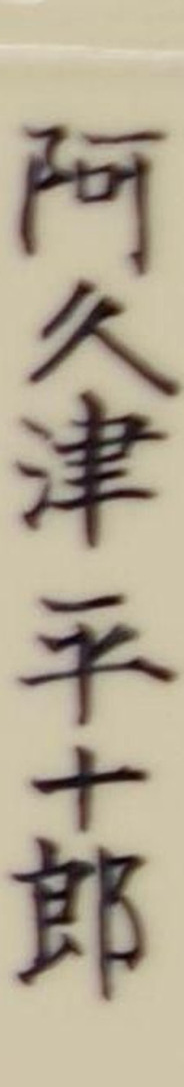阿久津平十郎
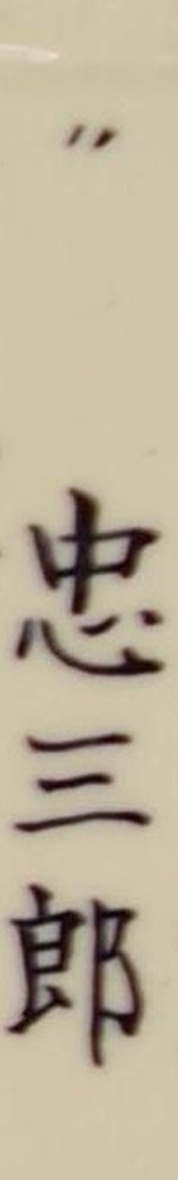忠三郎
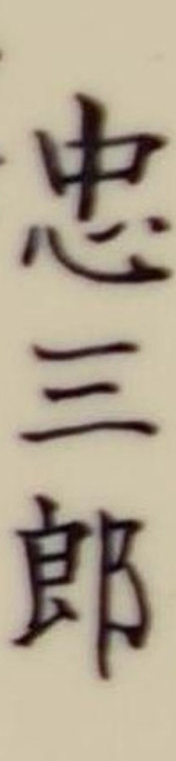忠三郎
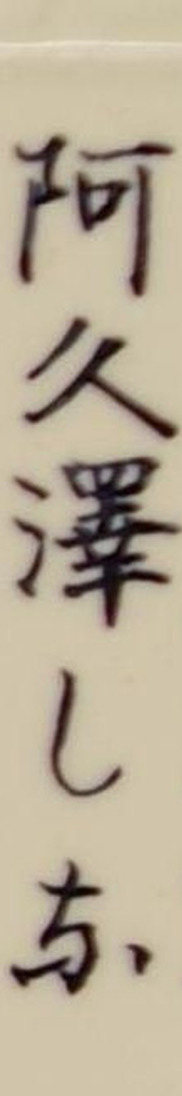阿久澤しな
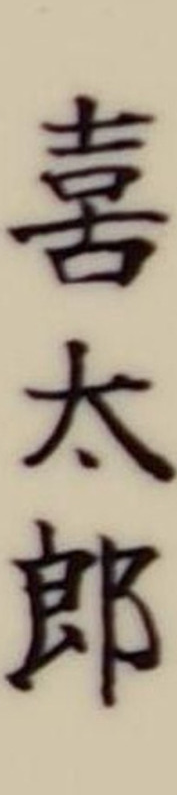喜太郎
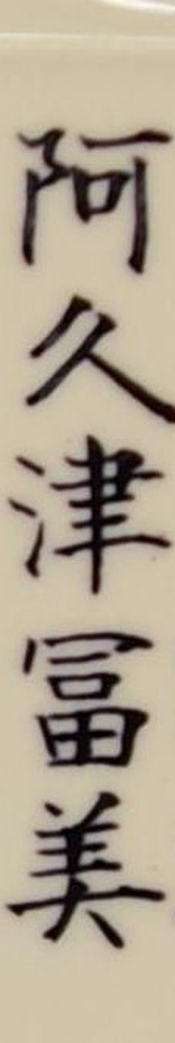阿久津冨美
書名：E~L
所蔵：高野山金剛峯寺
